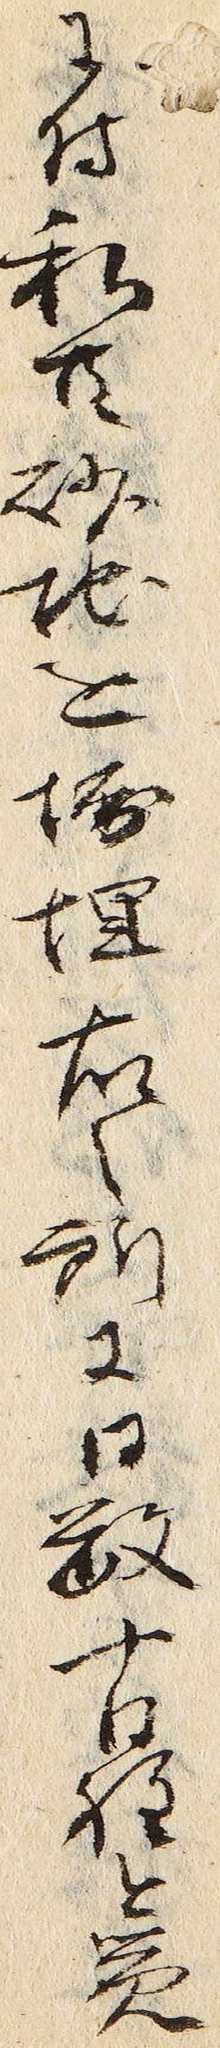に付私共砂地を堀埋右之所に日数十日程と覚
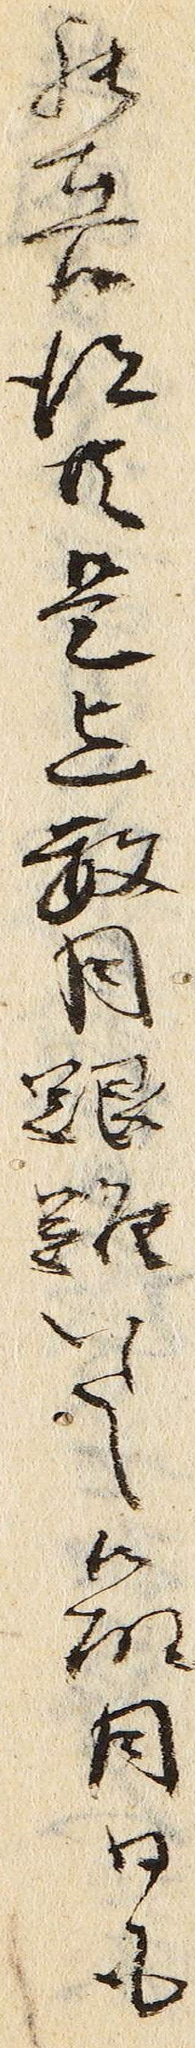罷在候得共是迄数月艱難いたし候故月日も
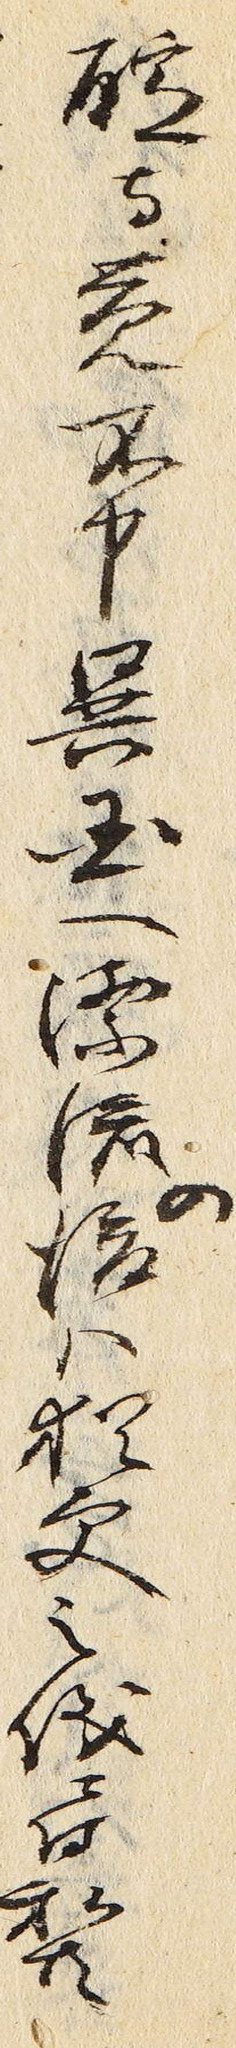聢と覚不申異国へ漂流の後は猶更之儀に付私共
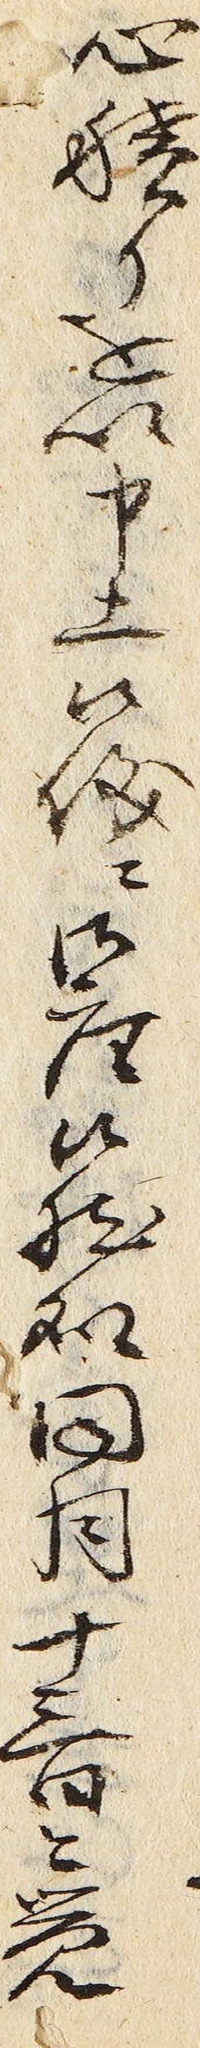心積りを以申上候儀に御座候然処同月十三日と覚
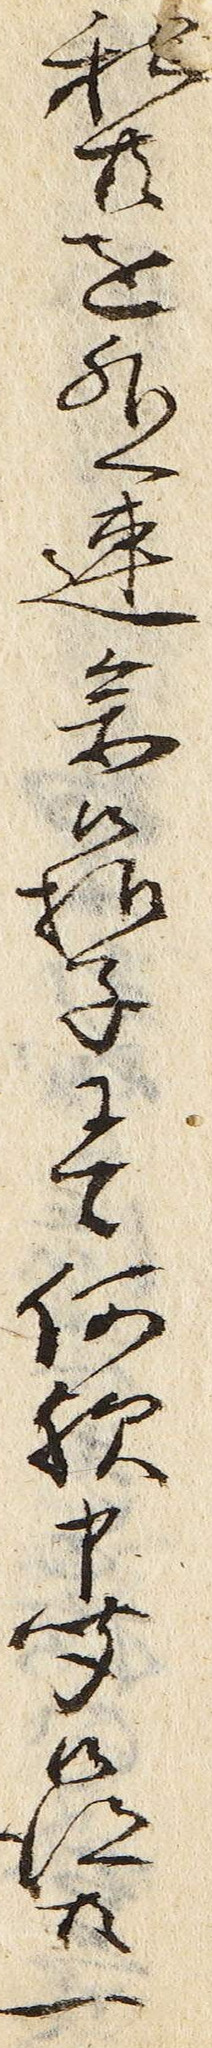私共を外へ連参候様子にて何歟申聞候得共一
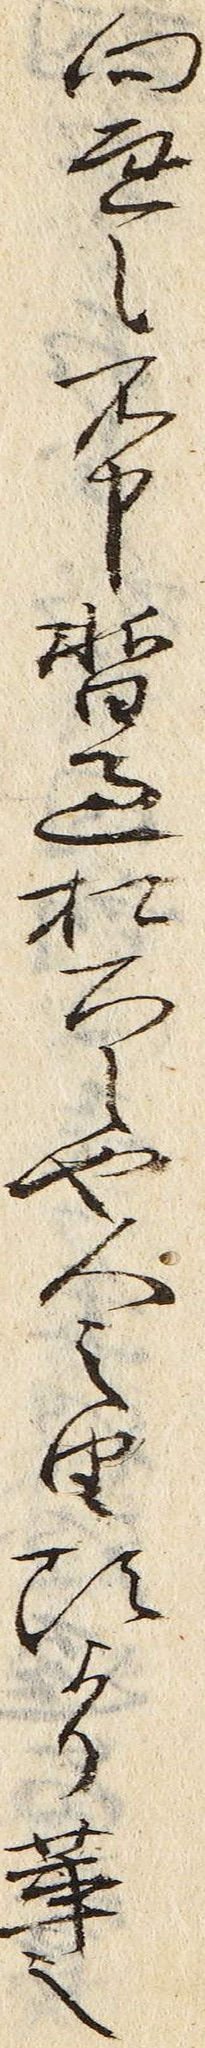向通し不申暫過おろしや人之由頭より革之
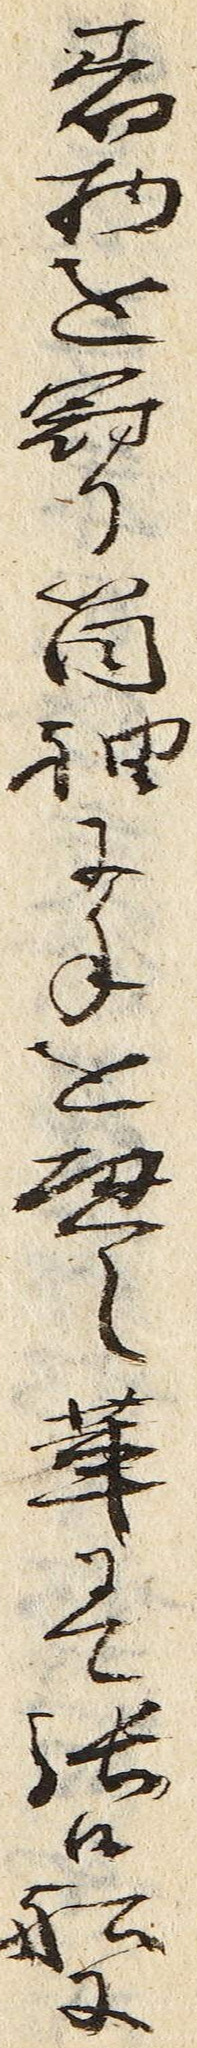着物を冠り筒袖に手を通し革にて張候船に
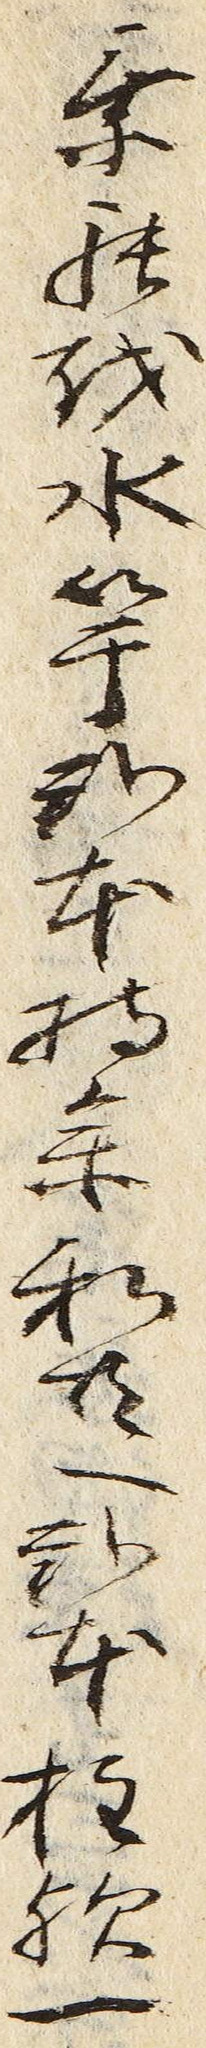乗罷越水竿弐本持参私共へ弐本柱歟一
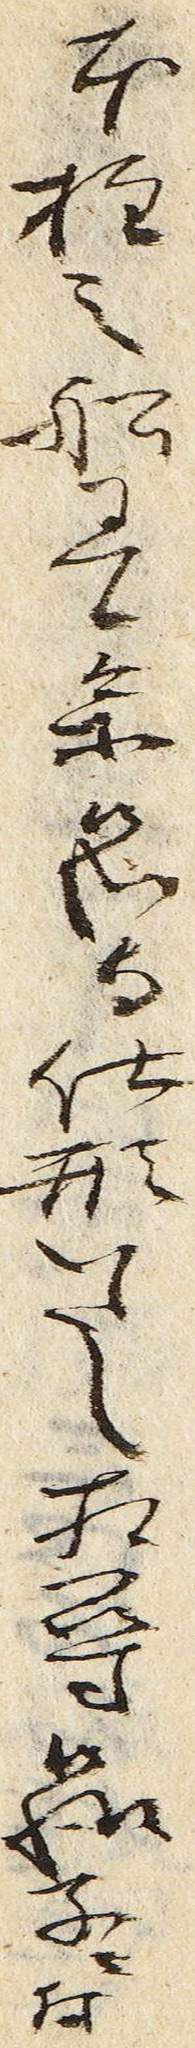本柱之船にて参候哉と仕形いたし相尋候様子に付
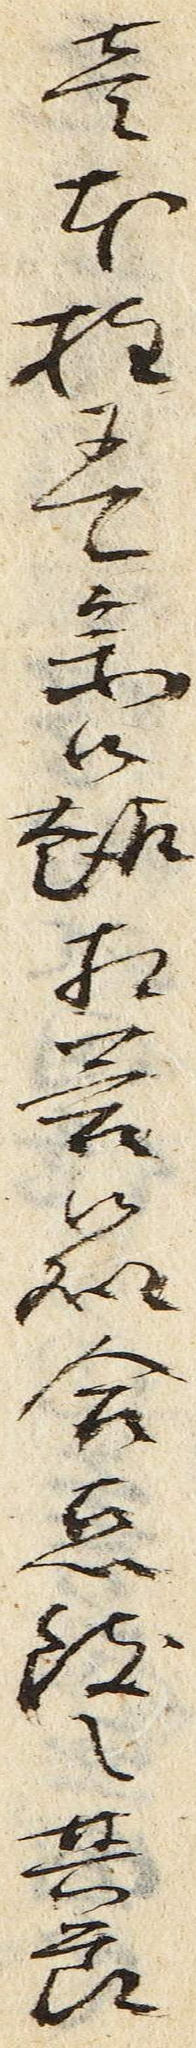壱本柱にて参候趣相答候処合点致し其節
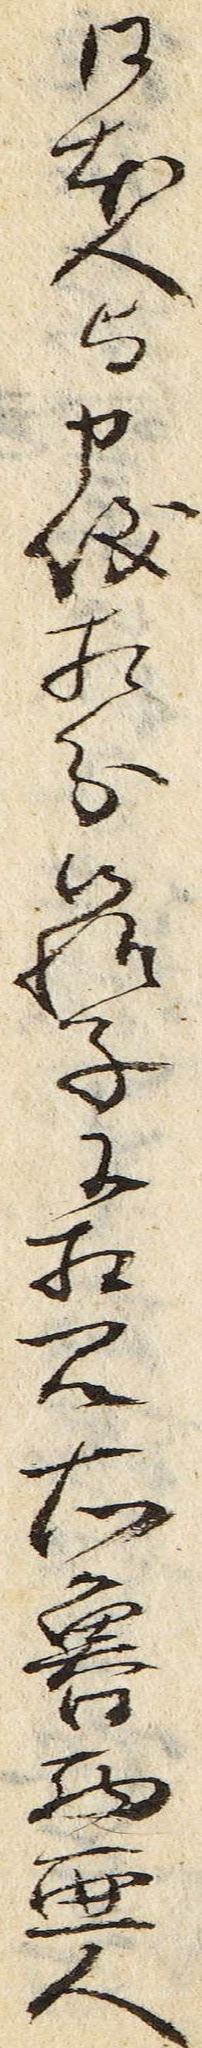日本人と申儀相分候様子に相見右魯西亜人
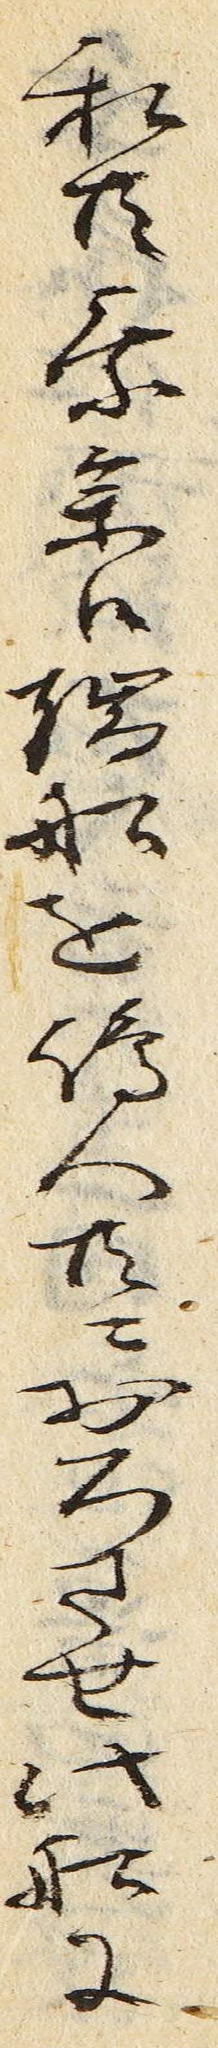私共乗参候端船を島人共におろさせ此船に

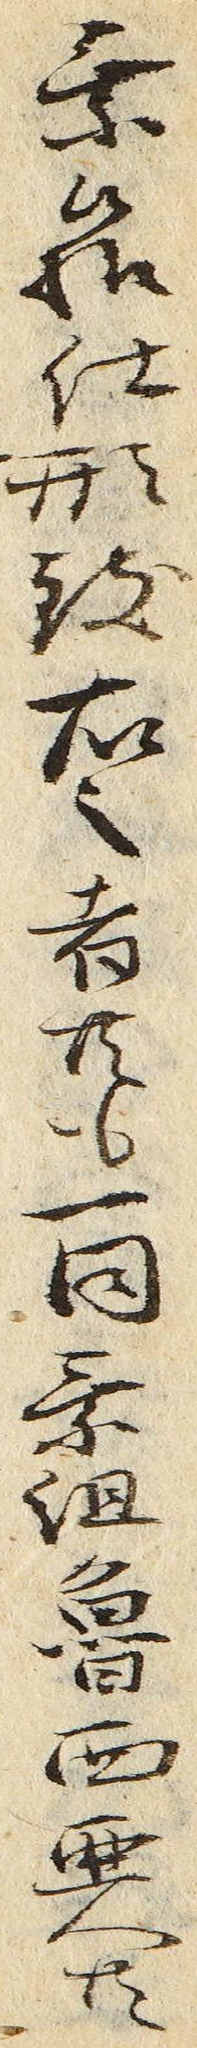乗候様仕形致右之者共も一同乗組魯西亜人共
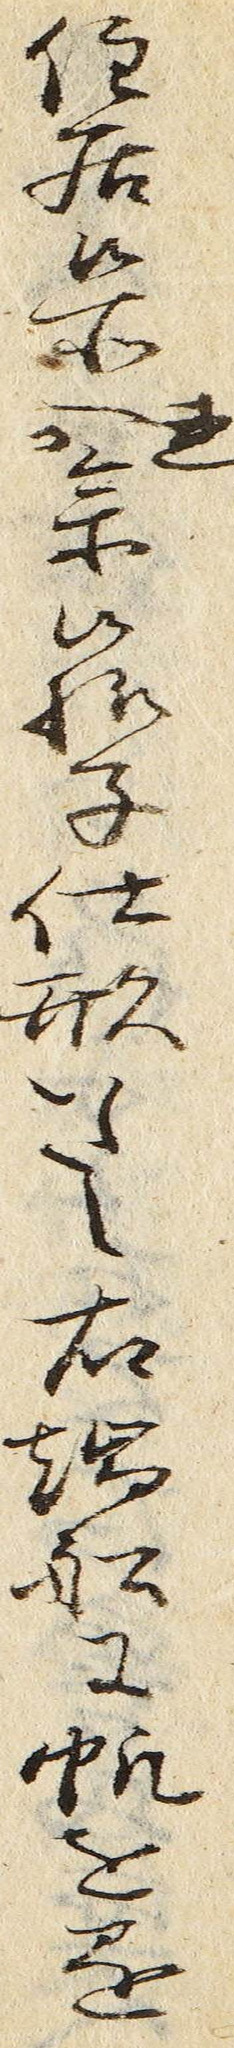住居候処へ連参候様子仕形いたし右端船に帆を懸
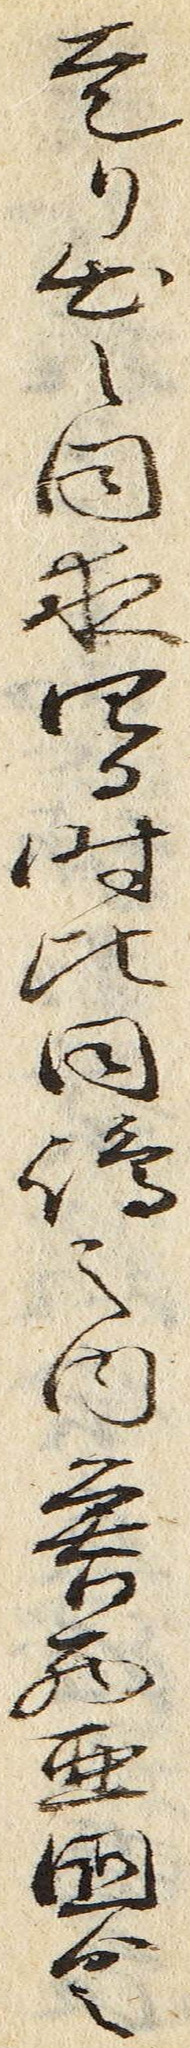走り出し同夜四ッ時比同島之内魯西亜国ゟ之
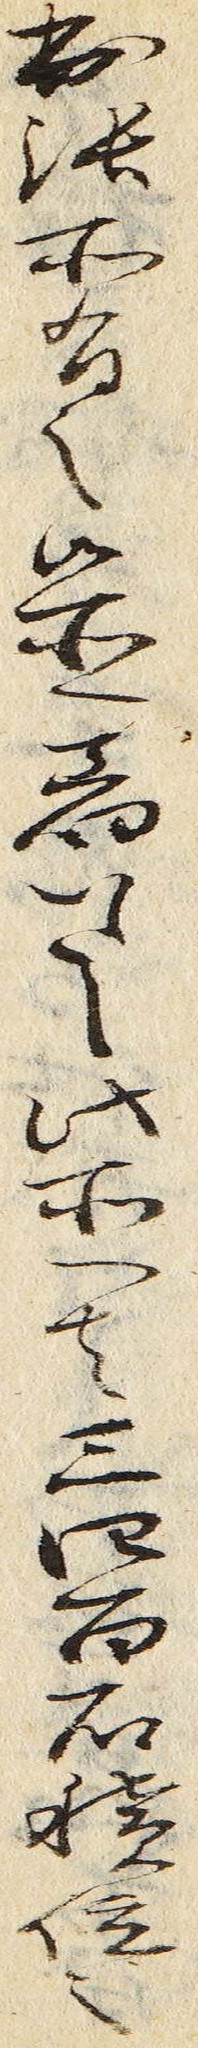出張所有之候所へ着いたし此所へは三四百石積位之
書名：漂民後記
